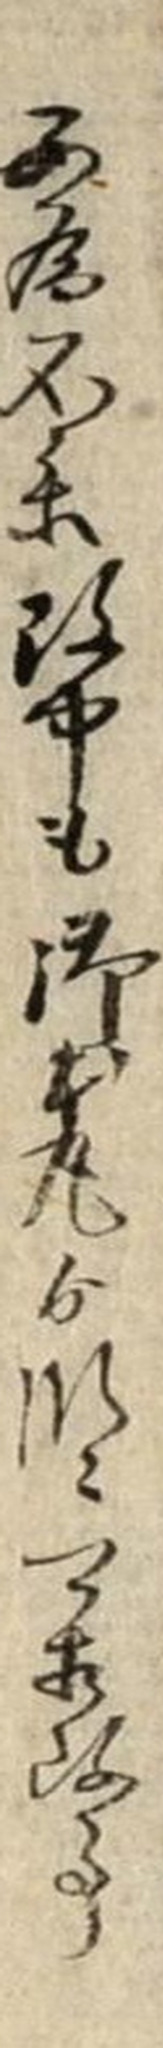為不参改中も御本丸ゟ段々可相改候事
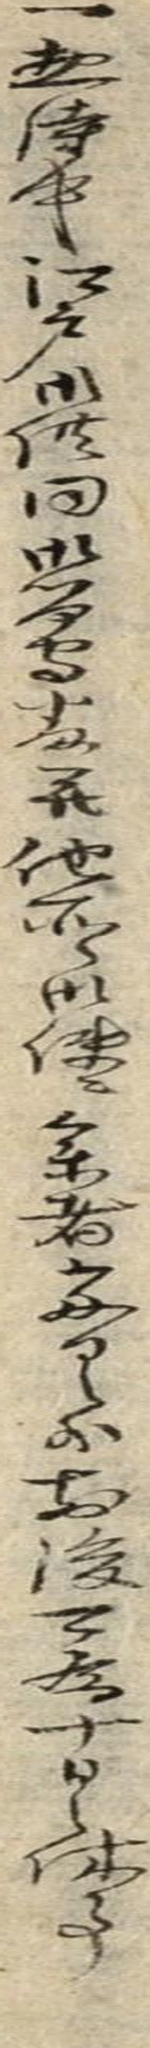一惣侍中江戸御供同御留守番并他所へ御使に参者当日之外前後可為十日之休候事
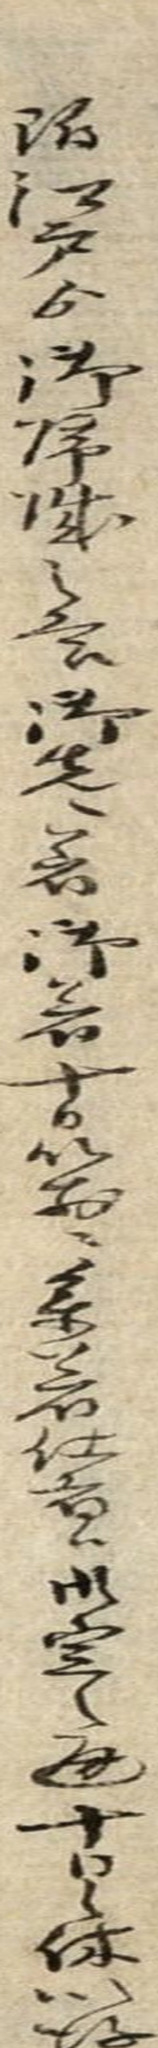附江戸ゟ御帰城之節御先へ着御着十日以前に参着仕者は御定之通十日之休以後
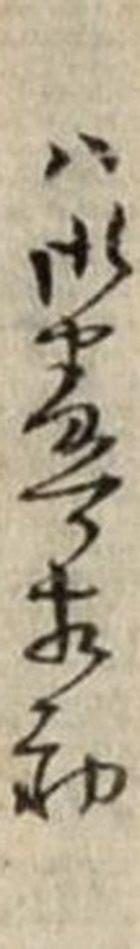は御番可相勤
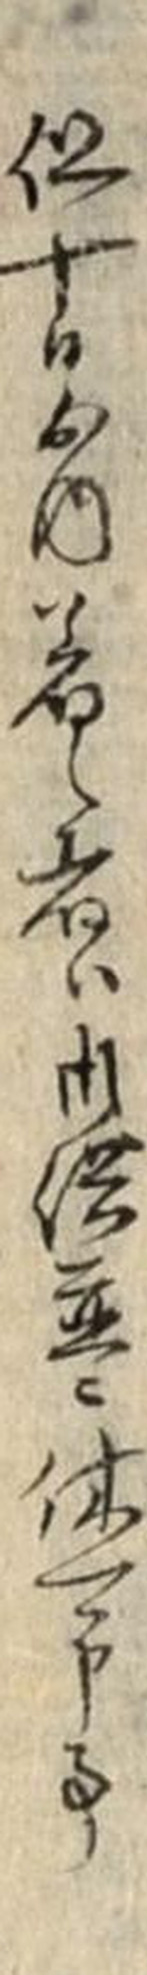但十日ゟ内着候者は御供並に休可申事
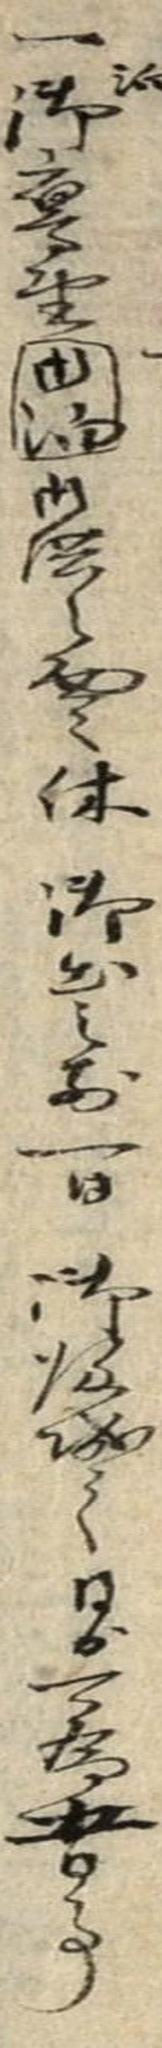一御鷹野御泊御供之面々休御出之前一日御帰城之日ゟ可為五日事
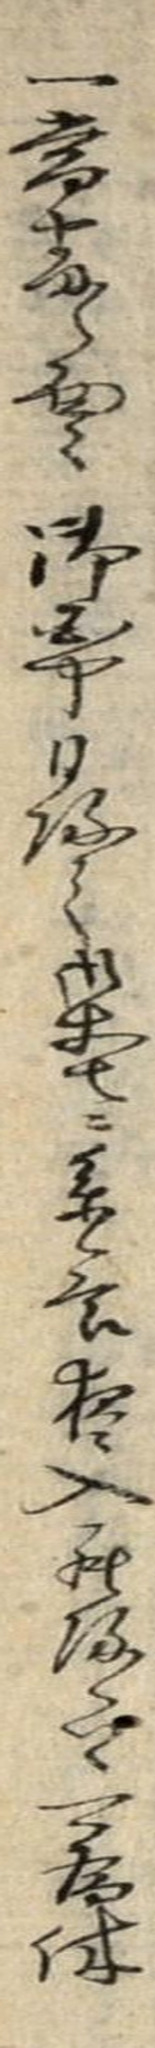一当番之面々御国中日帰之御使者に参候節夜に入罷帰候ハゝ可為休

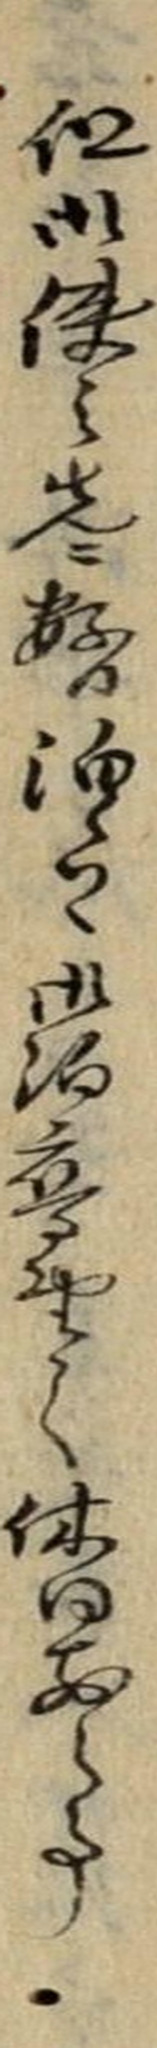但御使之先に数日泊候はゝ御泊鷹野之休日前之事
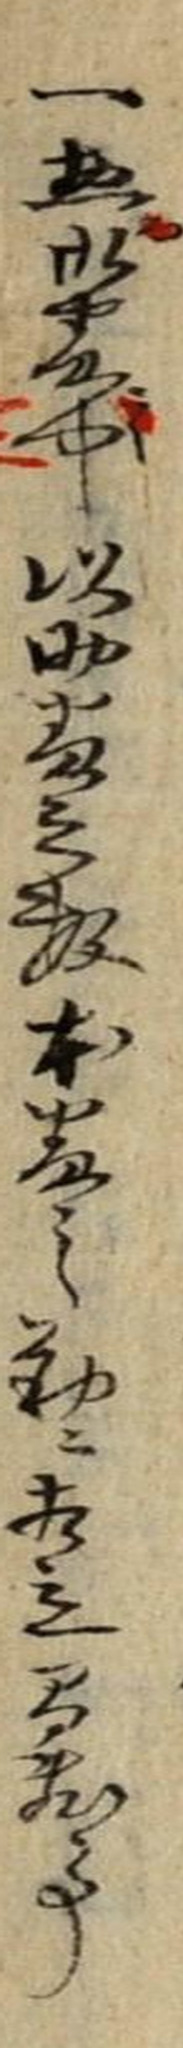一惣而御番中以助番之数本番之勤に相立間敷候事
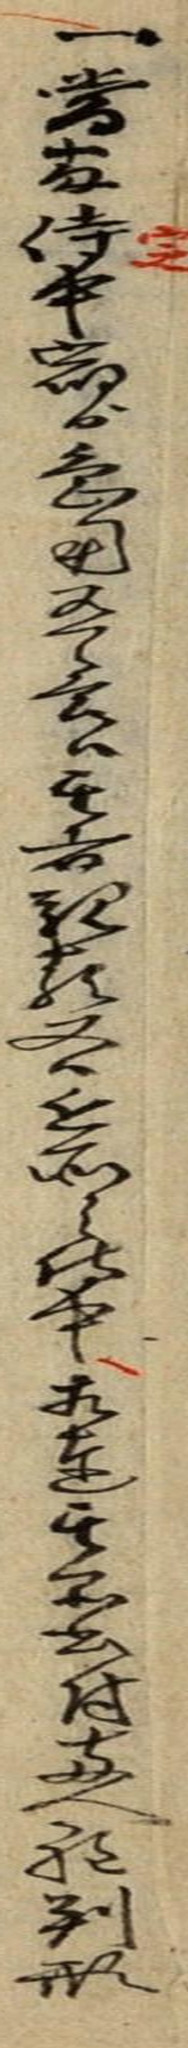一当番侍中宿ゟ急用有之候節は其者親類又は近所之侍中へ相達其品書付両人程判形
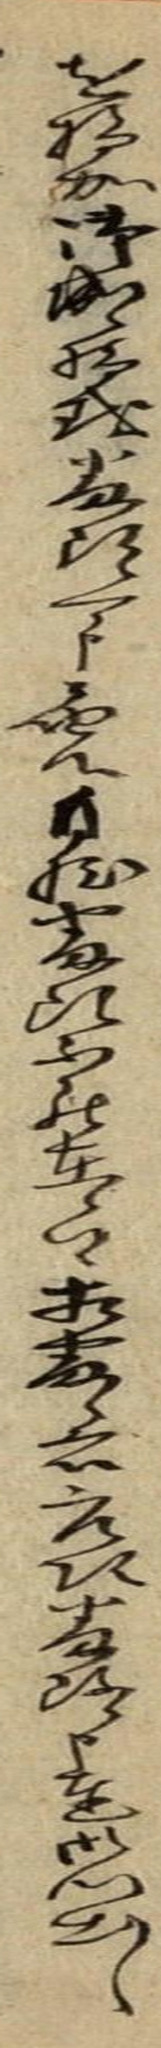を指加御城へ指越番頭へ可申届候自然番頭不罷在候はゝ相番之者取次番改へ申達御門出し
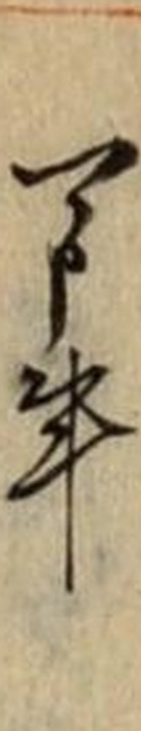可申事
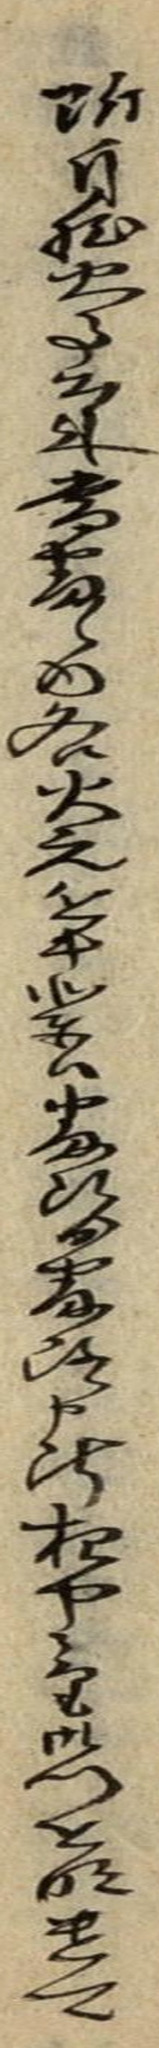附自然火事出来当番之内各火元近き輩は番頭ゟ番改へ申断夜中に而も御門を明遣可
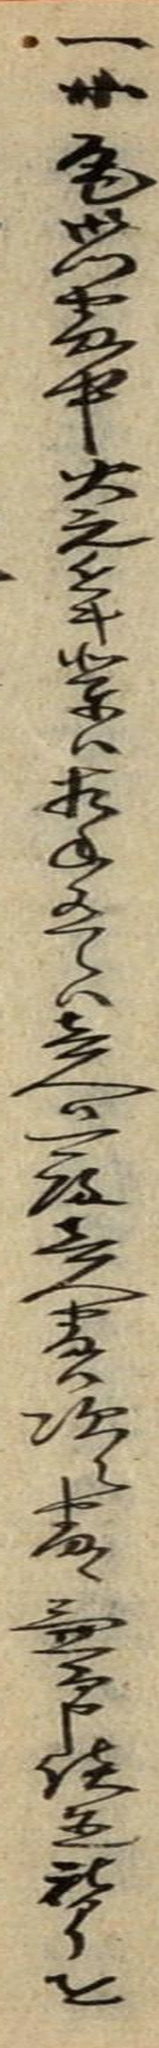一於瓦御門番中火元近き輩は相手有之候はゝ壱人は可帰壱人番は次之番へ兼而申談置替りを
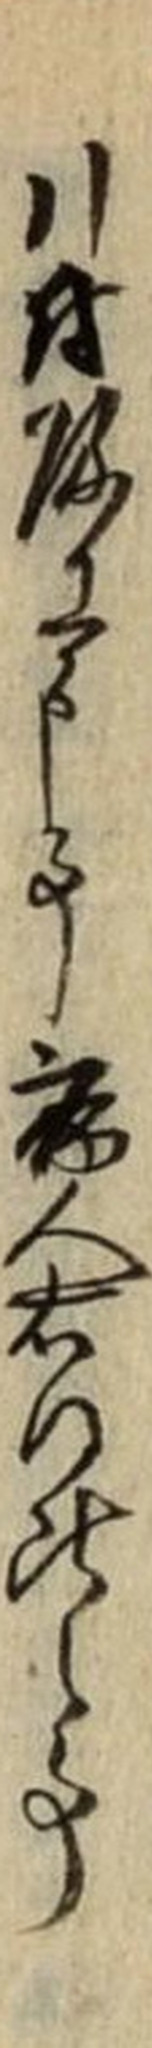引付帰り可申事病人右同断之事
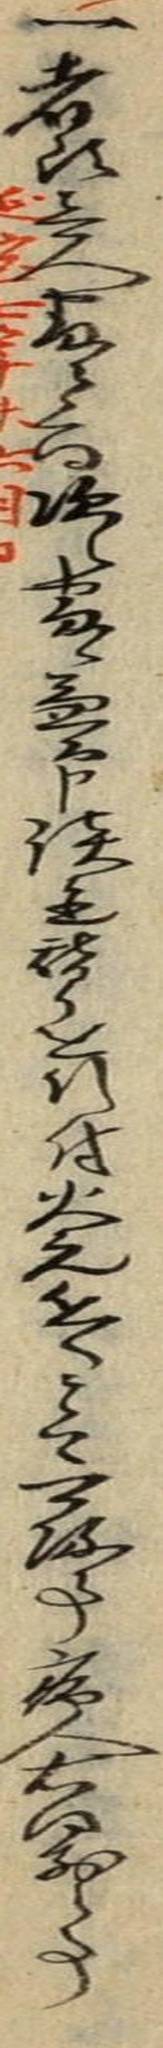一者頭壱人番に候間次之番へ兼而申談置替りを引付火元近く候はゝ可帰候事病人右同前之事
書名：蒐輯之部
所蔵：福井県文書館 Fukui Prefectural Archives
